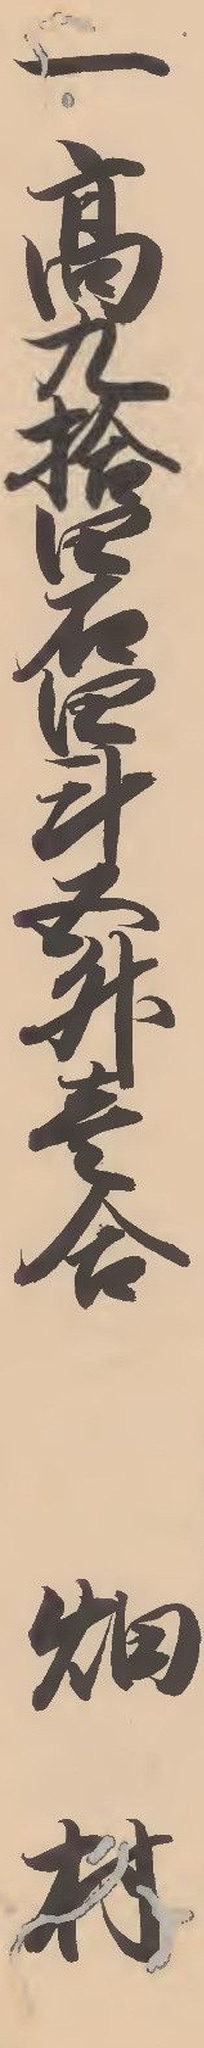一高九拾四石四斗五升壱合畑村

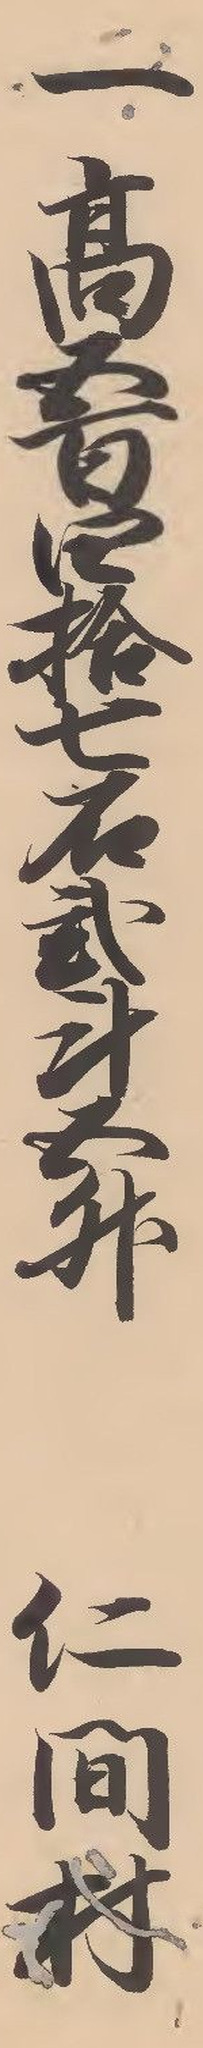一高五百四拾七石弐斗五升仁間村
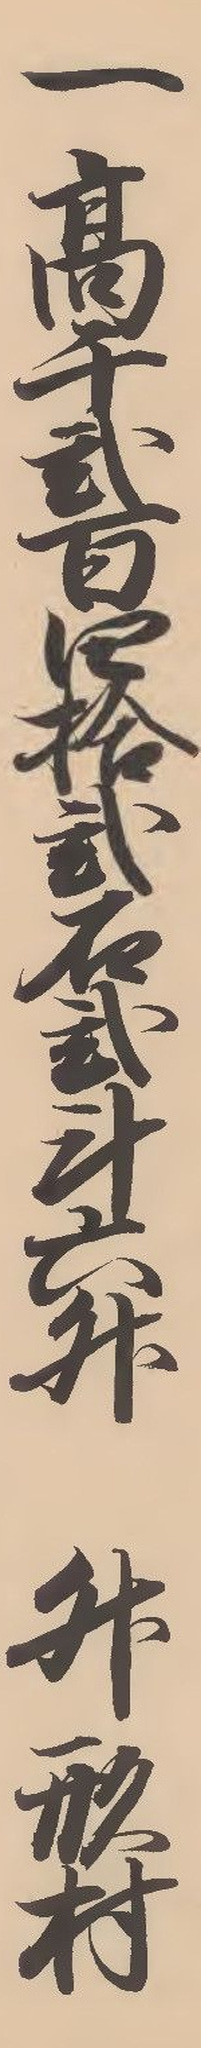一高千弐百四拾弐石弐斗六升升形村
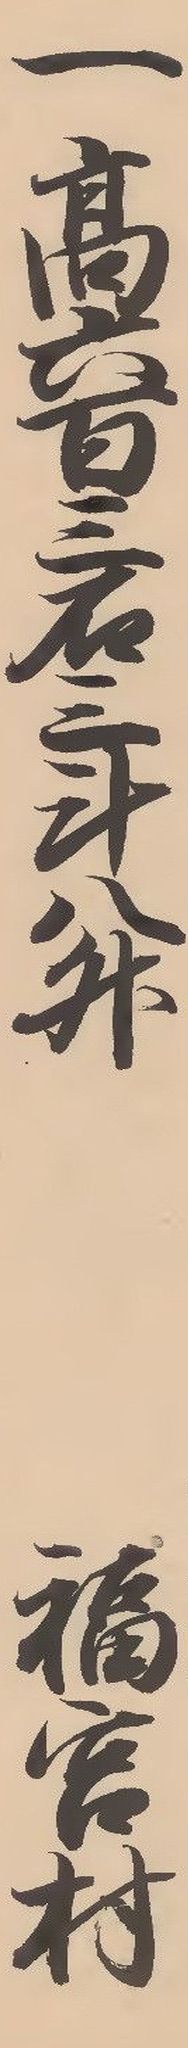一高六百三石三斗八升福宮村
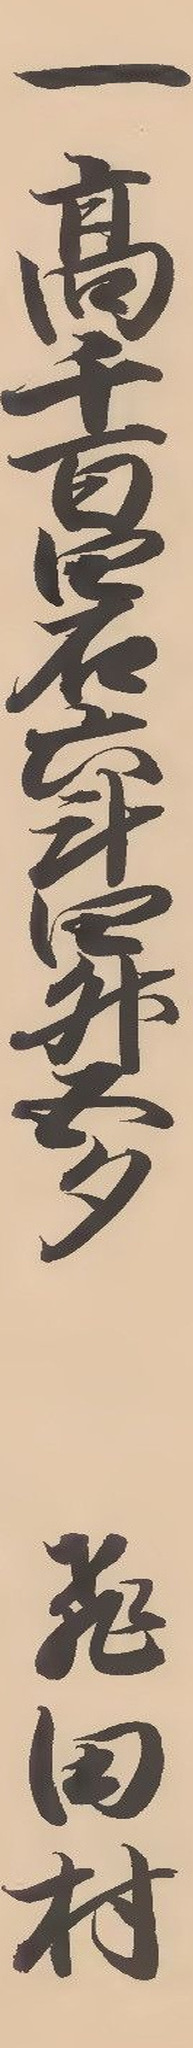一高千百四石六斗四升五勺飛田村
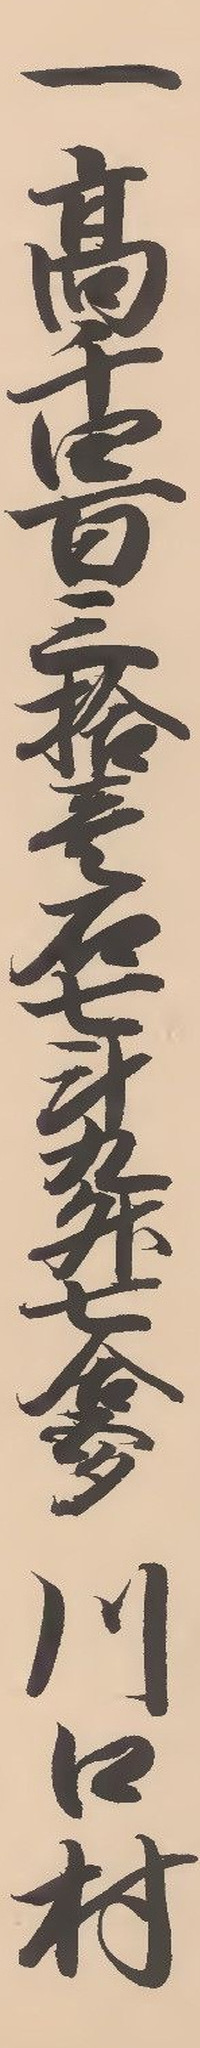一高千四百三拾壱石七斗九升七合五勺川口村
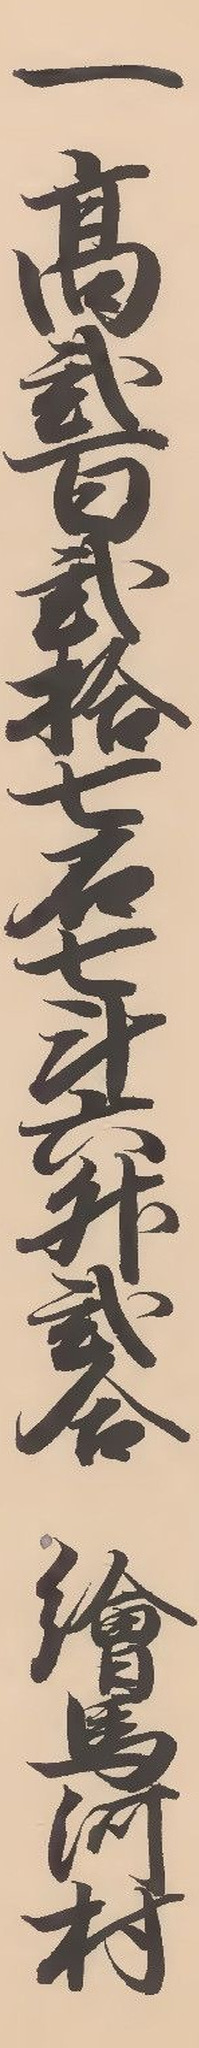一高弐百弐拾七石七斗六升弐合絵馬河村
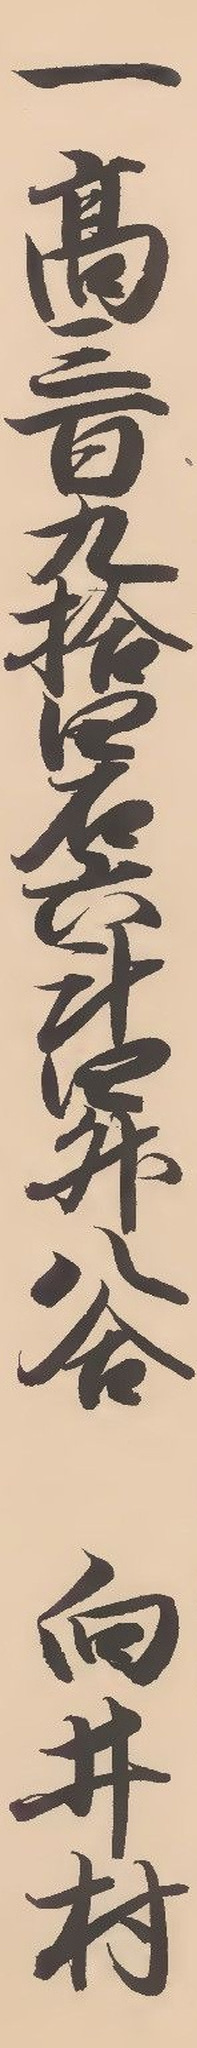一高三百九拾四石六斗四升八合向井村
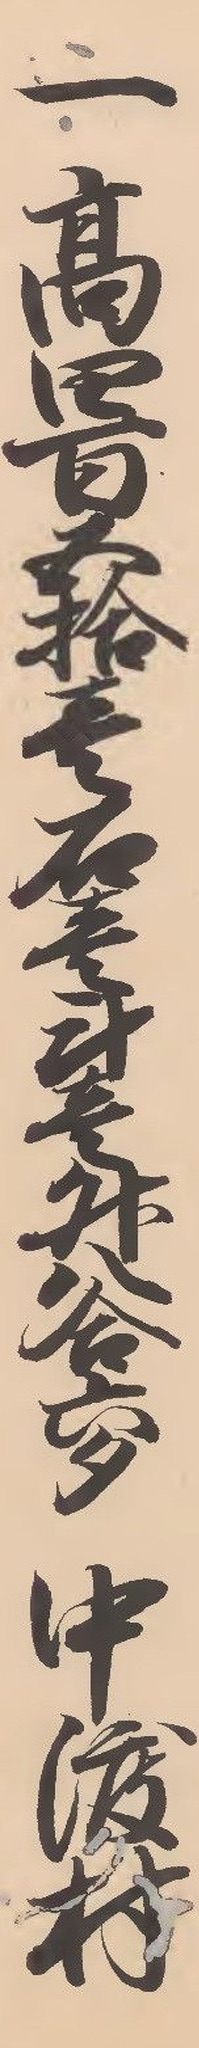一高四百五拾壱石壱斗壱升八合六勺中渡村

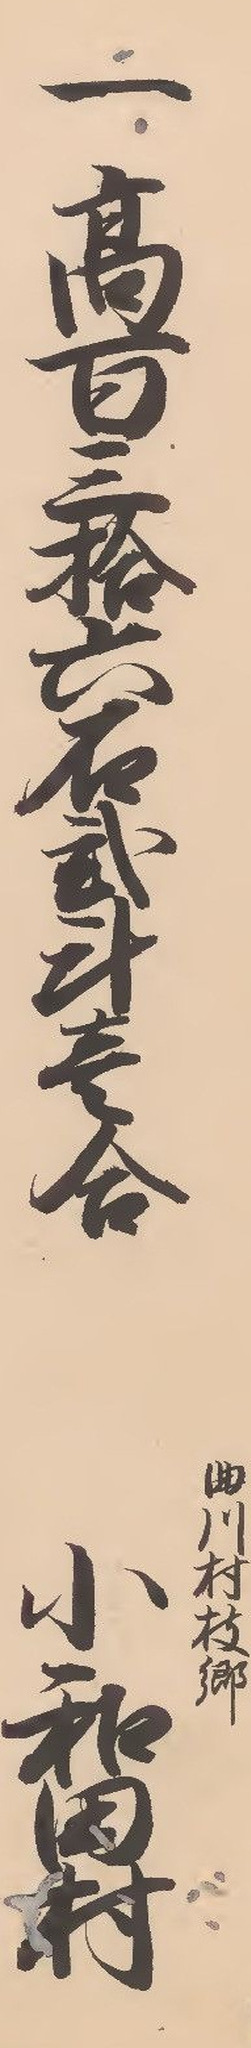一高百三拾六石弐斗壱合小和田村
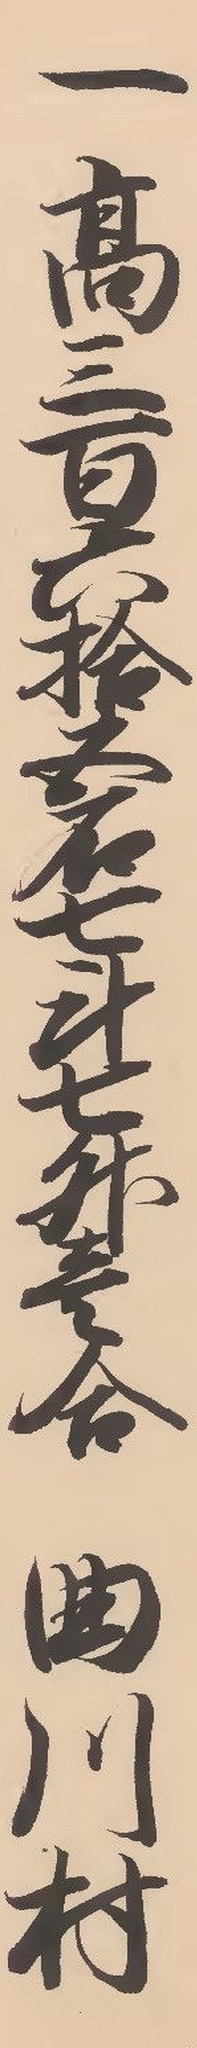一高三百六拾五石七斗七升壱合曲川村
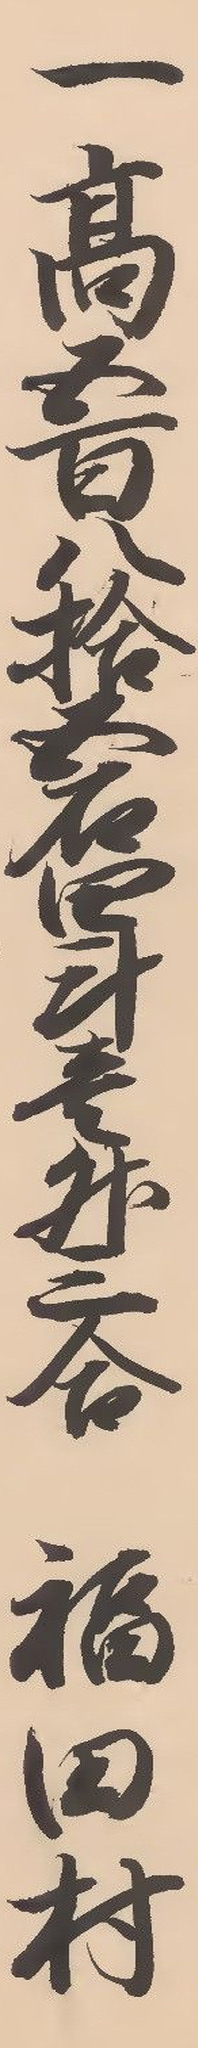一高五百八拾五石四斗壱升三合福田村
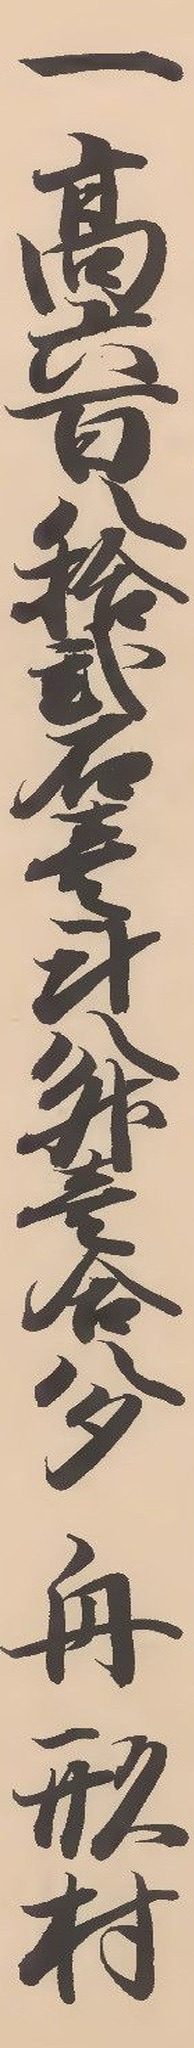一高六百八拾弐石壱斗八升壱合八勺舟形村
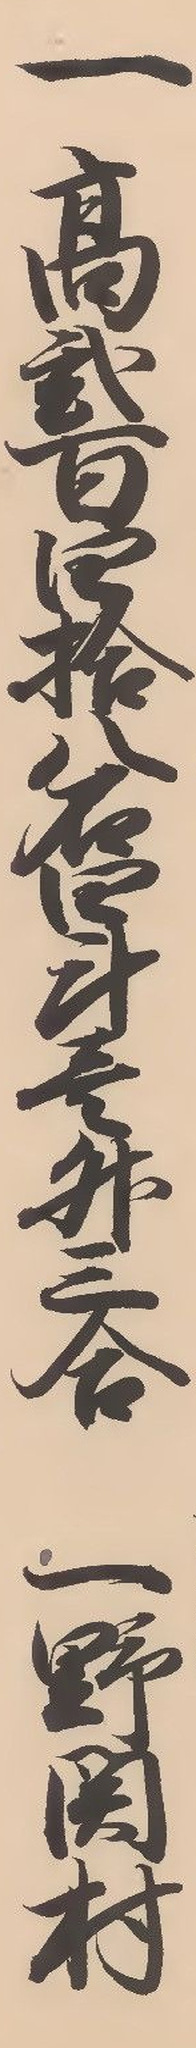一高弐百四拾八石四斗壱升三合一野岡村
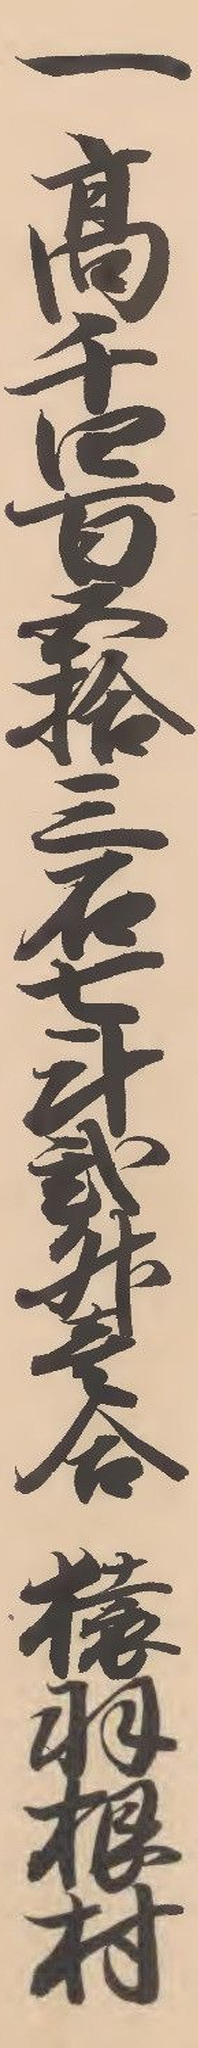一高千四百五拾三石七斗弐升壱合猿羽根村
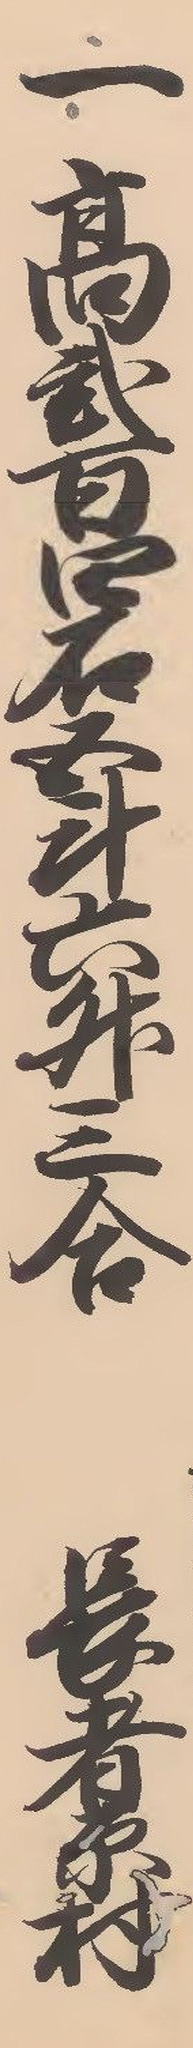一高弐百四石五斗六升三合長者原村
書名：出羽国郷帳　３
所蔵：国立公文書館 National Archives of Japan
